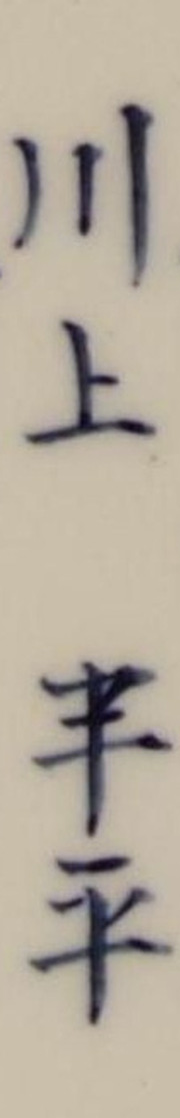川上半平
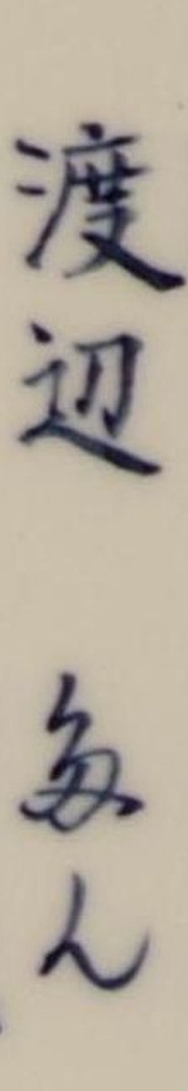渡辺たん
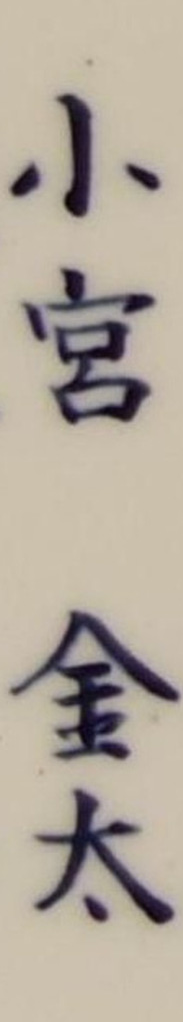小宮金太
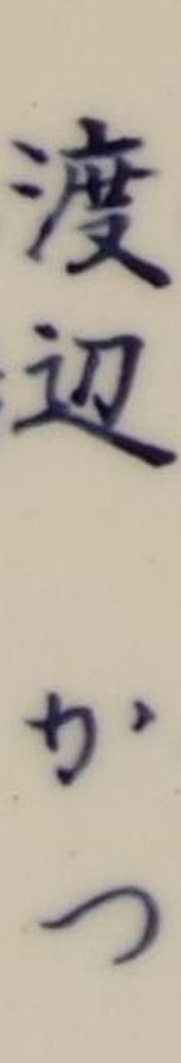渡辺かつ
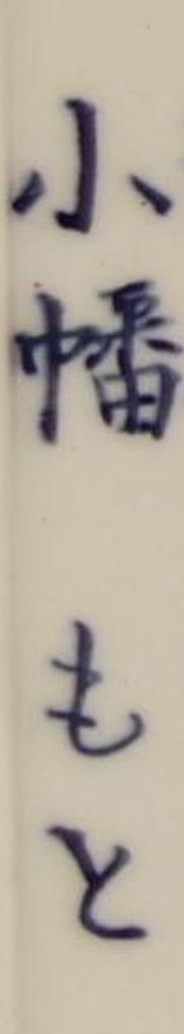小幡もと

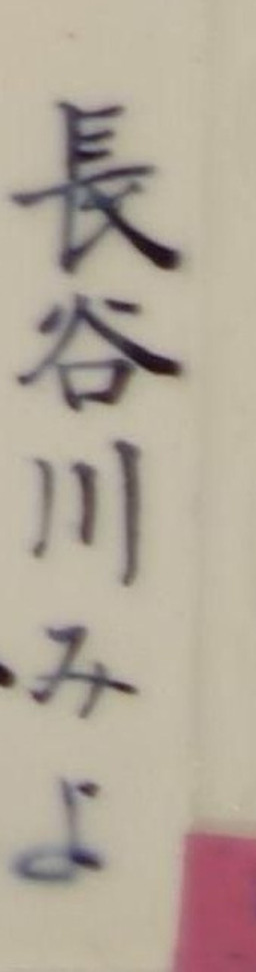長谷川みよ
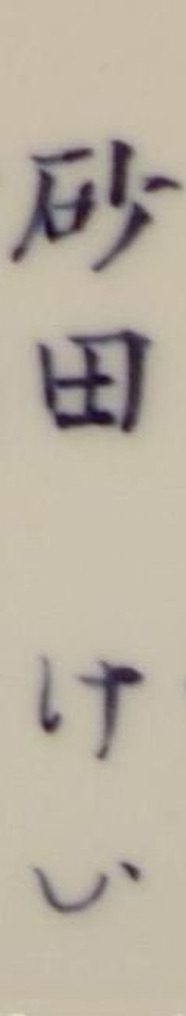砂田けい
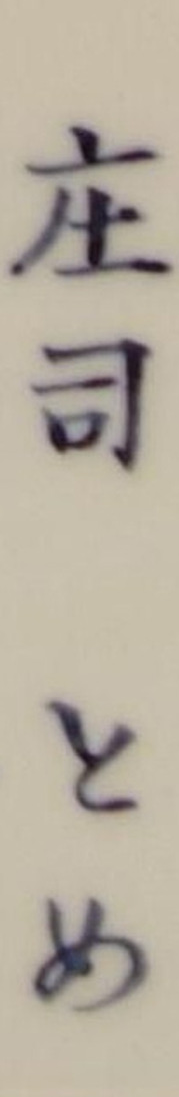庄司とめ
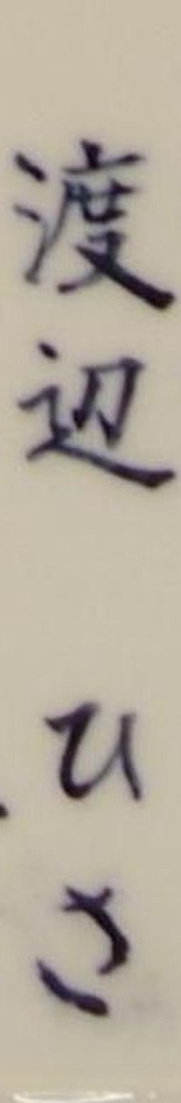渡辺ひさ
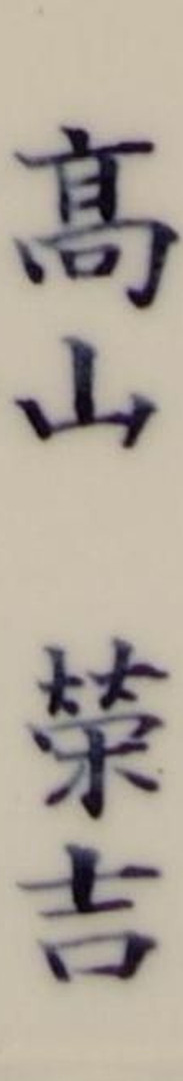高山榮吉
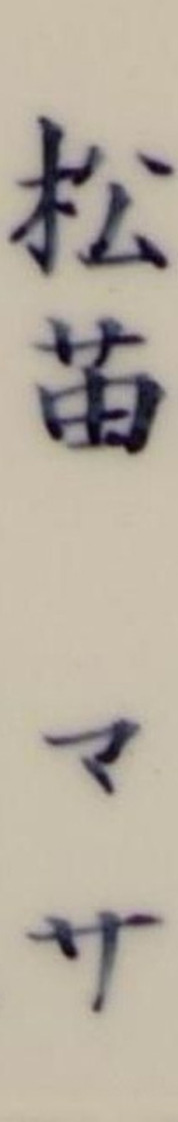松苗マサ
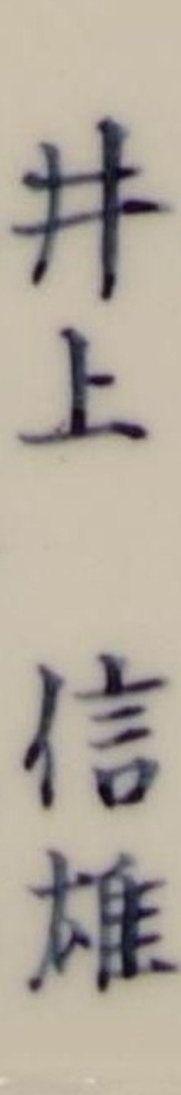井上信雄
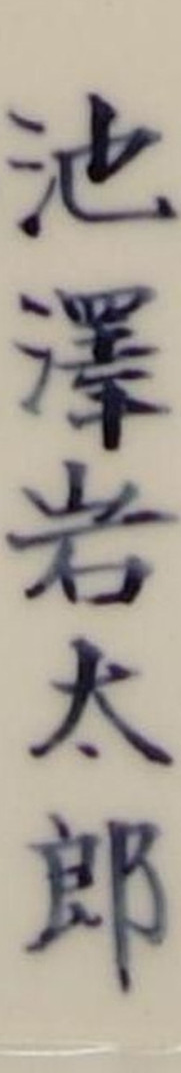池澤岩太郎
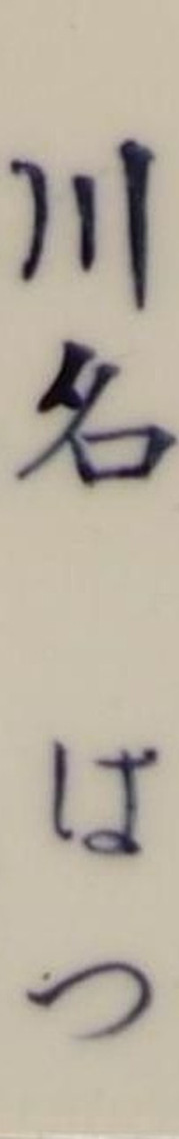川名はつ
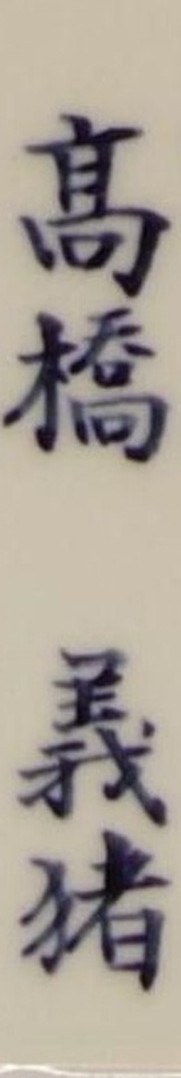高橋義猪
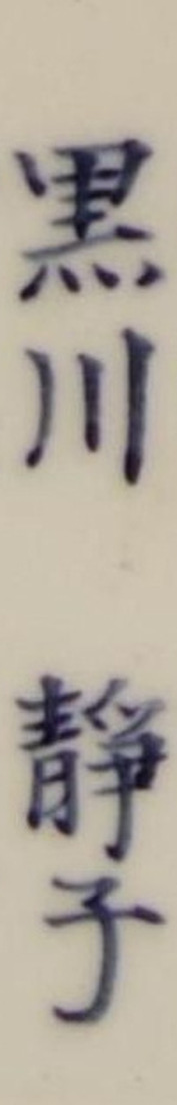黒川静子
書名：M~S
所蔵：高野山金剛峯寺
